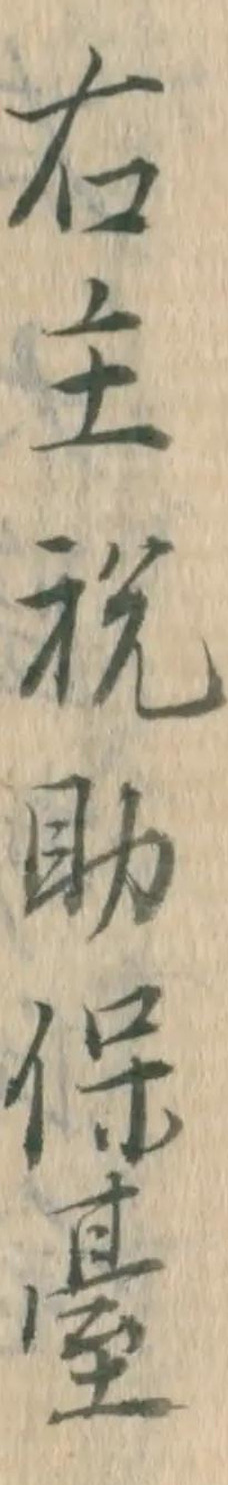右主税助保台
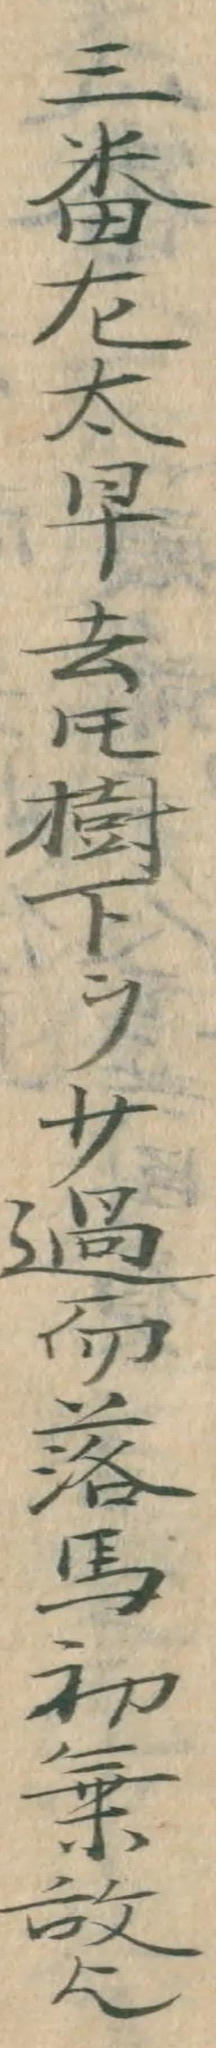三番左太早去トモ樹下ヲ少過而落馬初乗故也
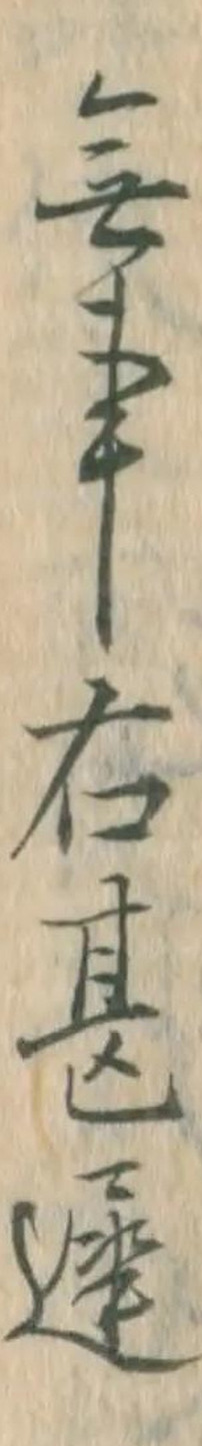無事右甚遅

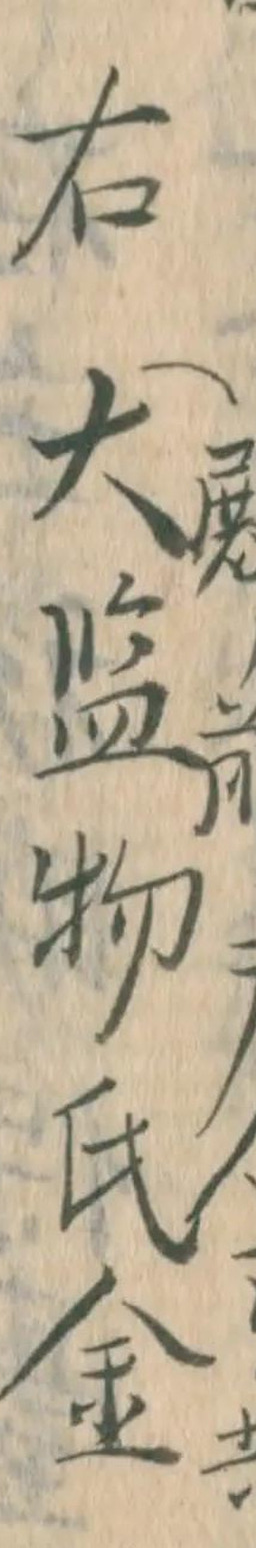右大監物氏金
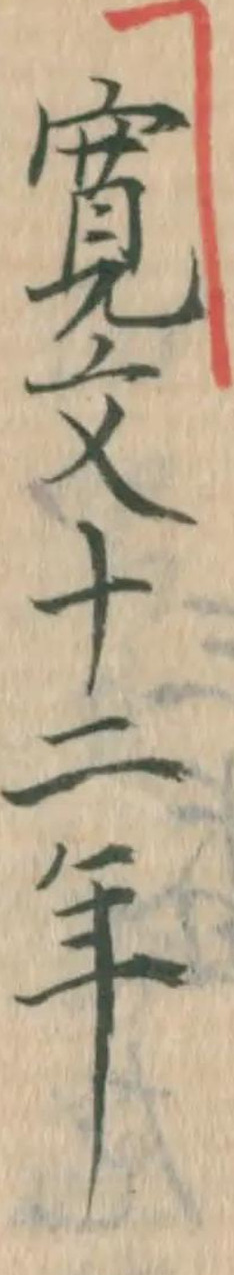寛文十二年
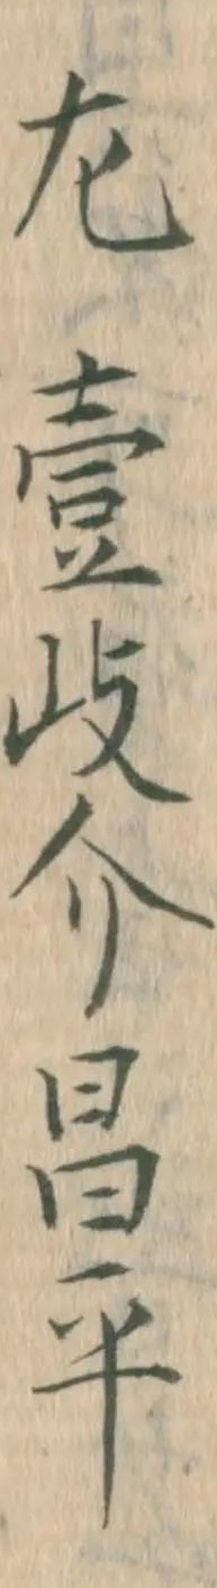左壹岐介昌平
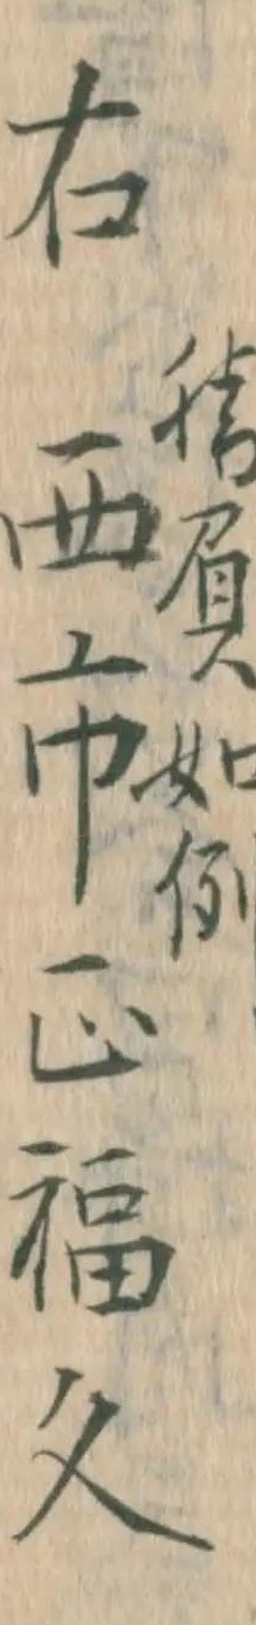右西市正福久
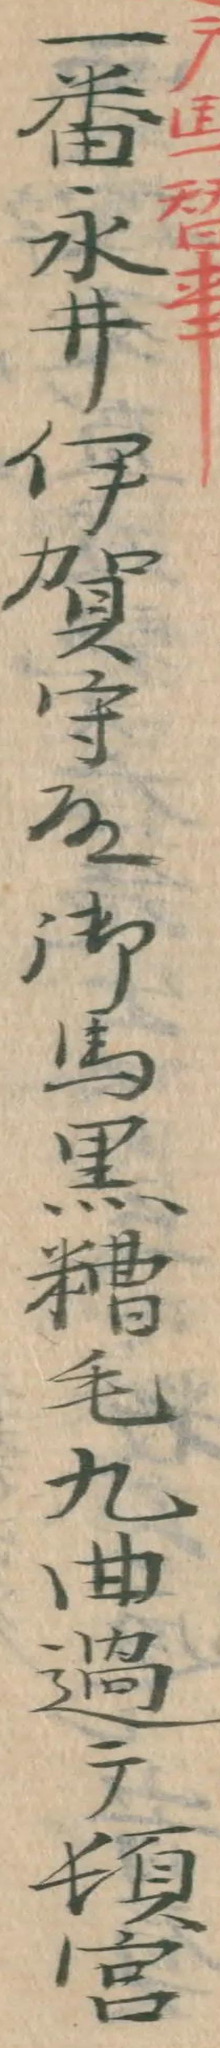一番永井伊賀守殿御馬黒糟毛九曲過テ頓宮
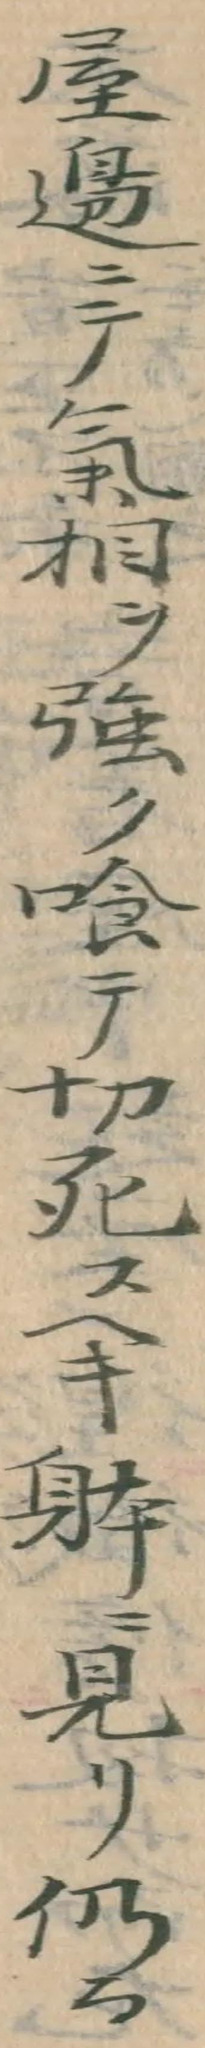屋辺ニテ気相ヲ強ク喰テ切死スヘキ体ニ見リ仍而
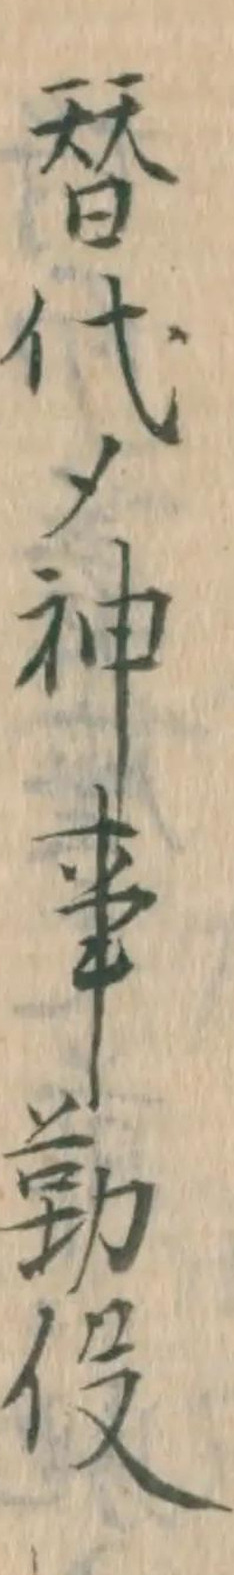替代シテ神事勤役
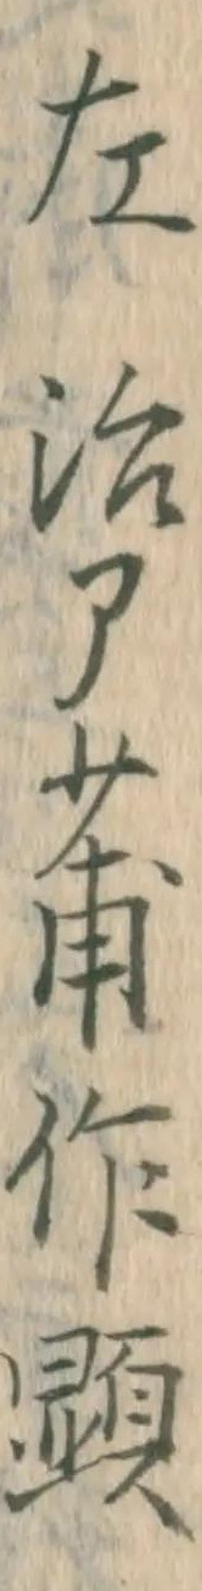左治部少輔作顕
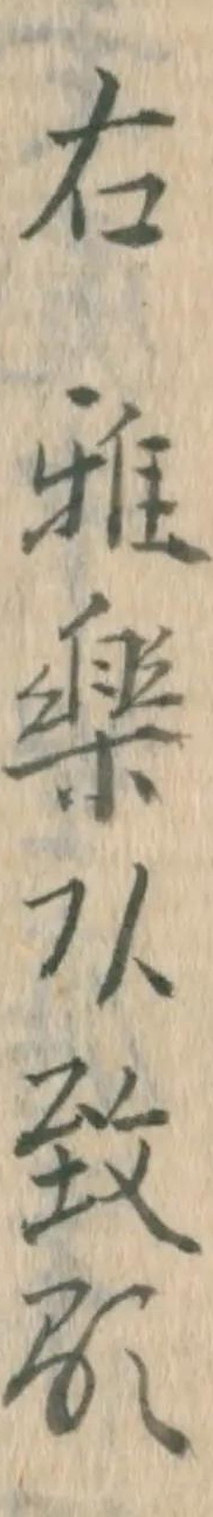右雅楽頭致顕
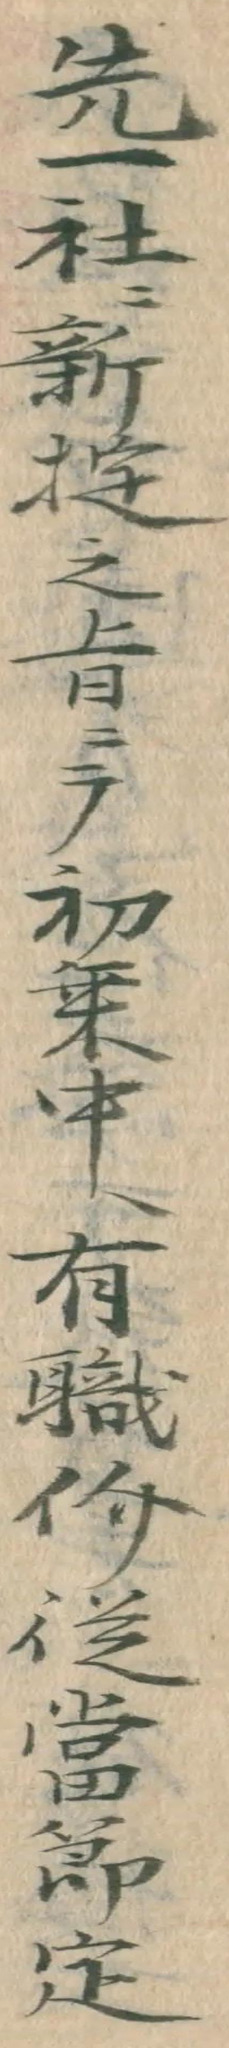先一社ニ新掟之旨ニテ初乗中ヘ有職价従当節定
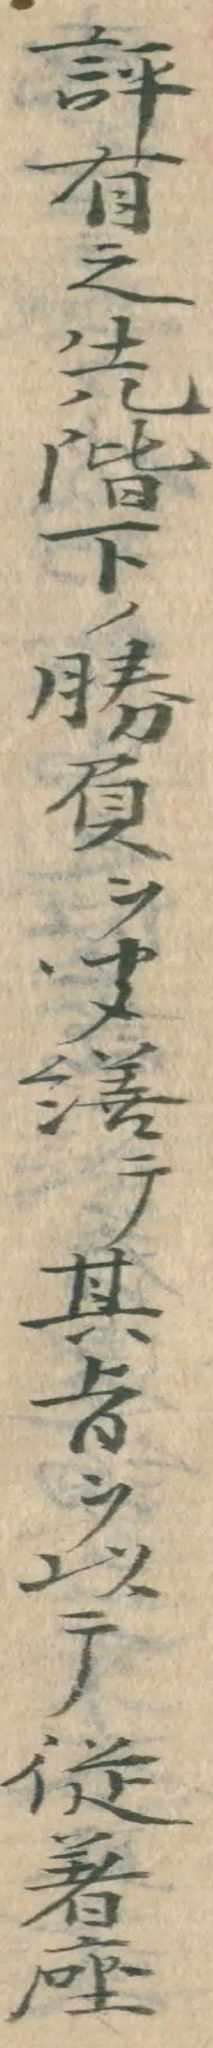評有之先階下ノ勝負ヲ聞繕テ其旨ヲ以テ従着座
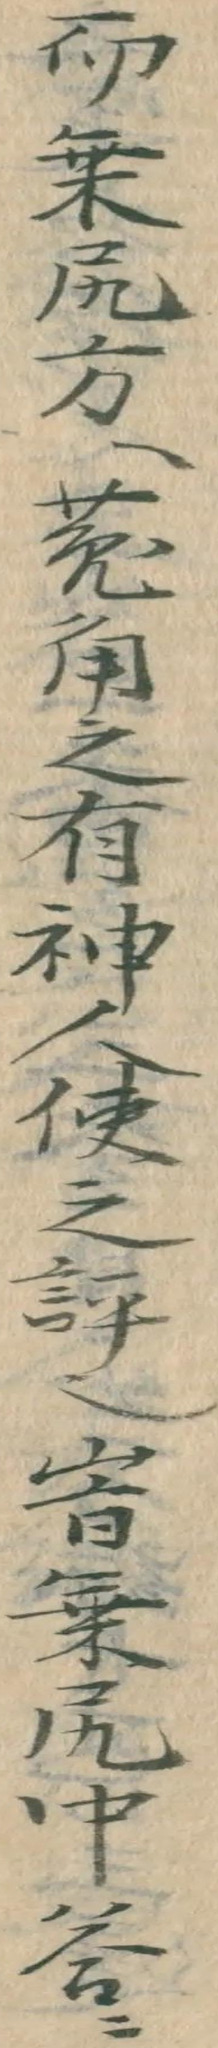而乗尻方ヘ兎角之有神人使之評也旹乗尻中答ニ
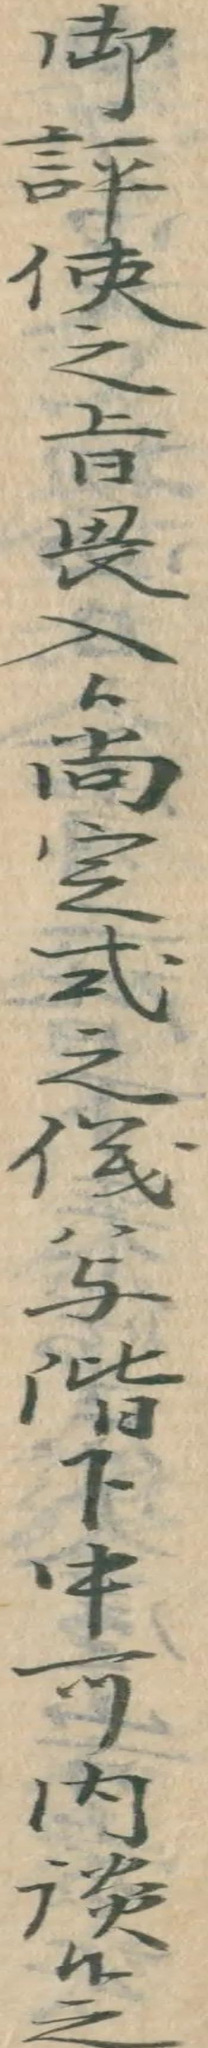御評使之旨畏入候尚定式之儀ハ与階下中可内談候之
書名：賀茂社記録. 第10冊
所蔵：国立国会図書館 National Diet Library, JAPAN
